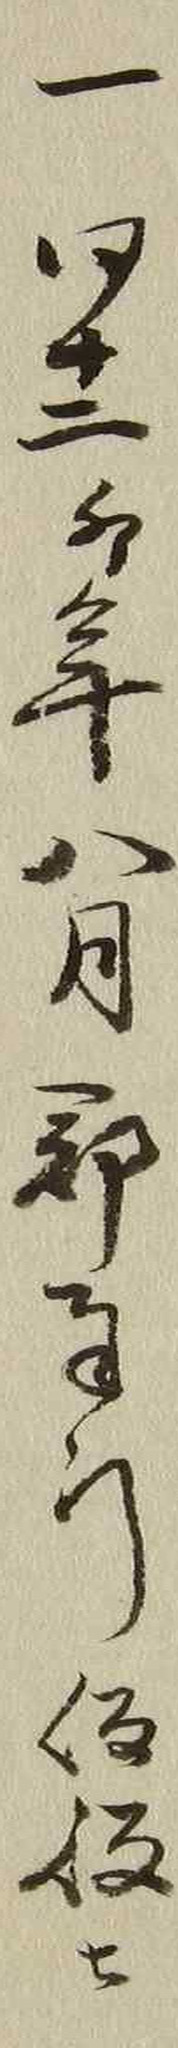一同十二卯年八月郡奉行仮役被
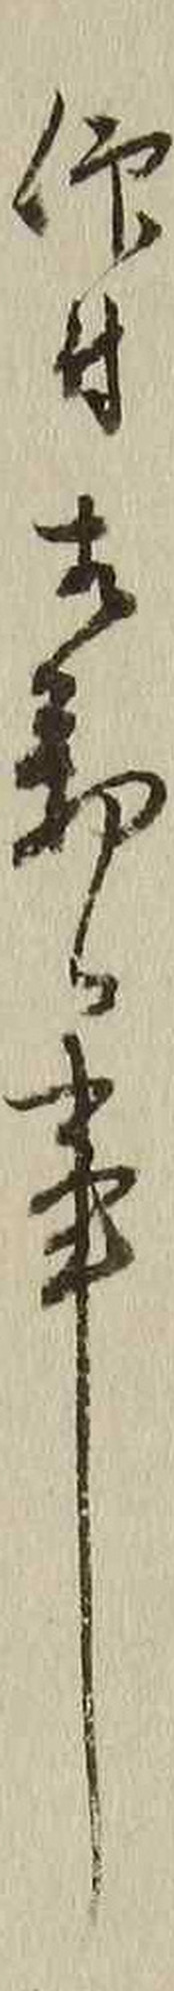仰付相勤候事
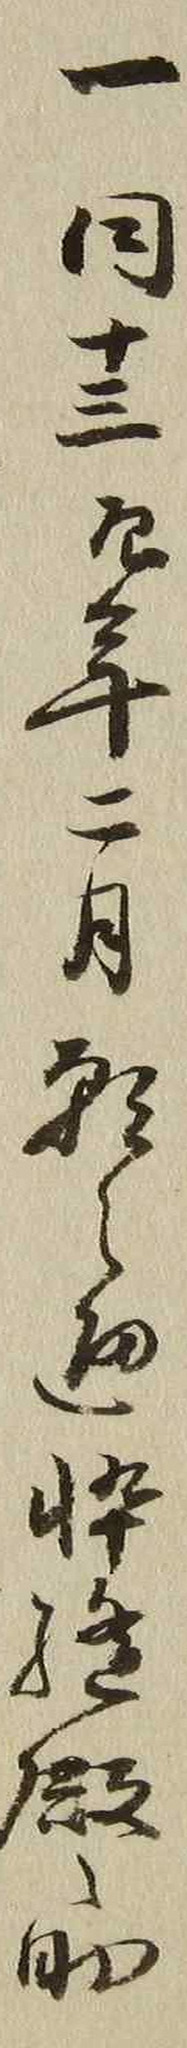一同十三辰年二月願之通忰縫殿之助
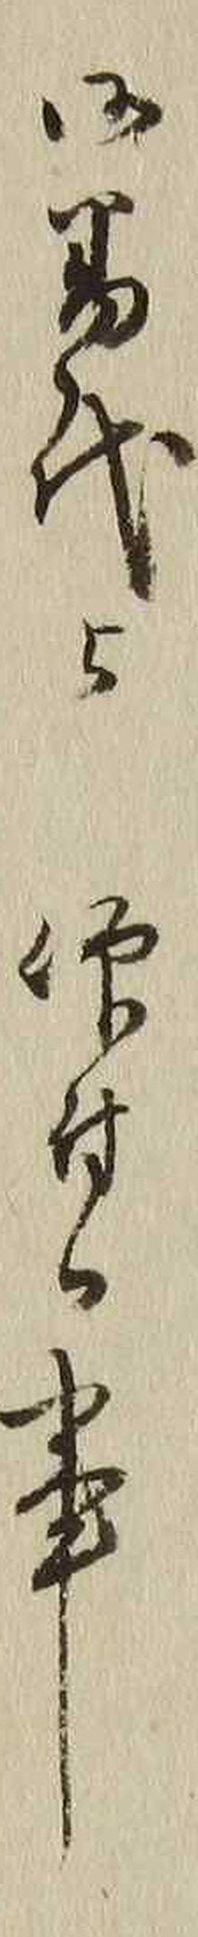御番代被仰付候事
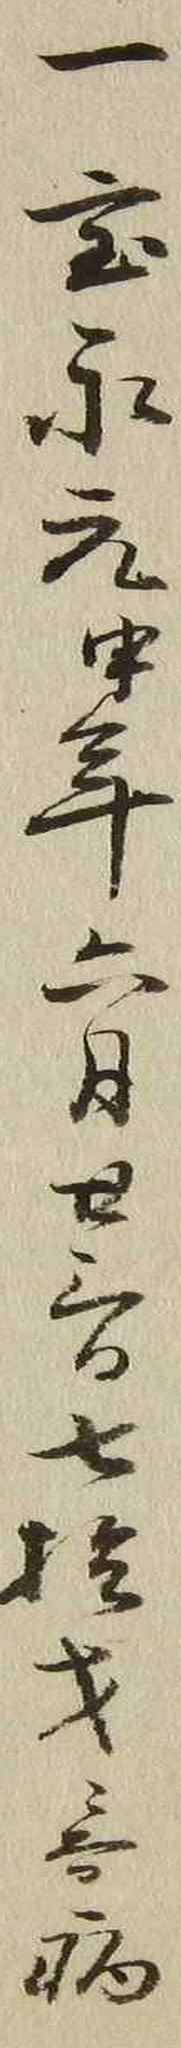一宝永元申年六月廿三日七拾才ニ而病
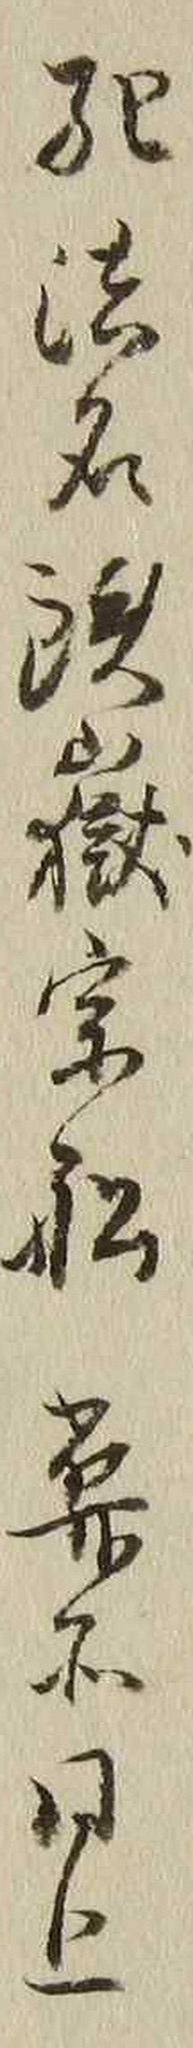死法名鉄嶽宗船葬所同上
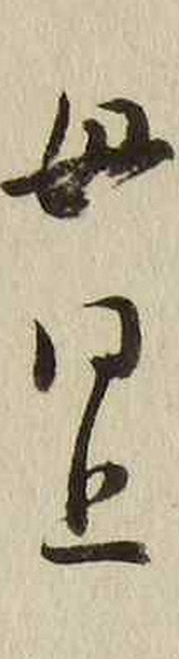母同上
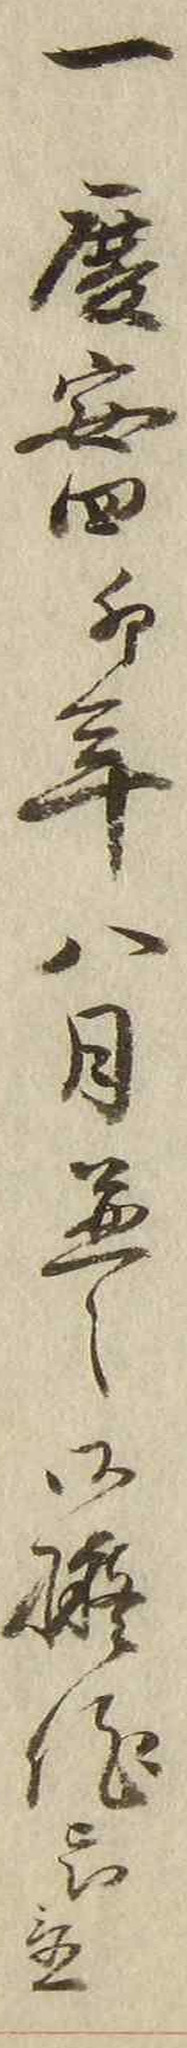一慶安四卯年八月並之御擬作被下置

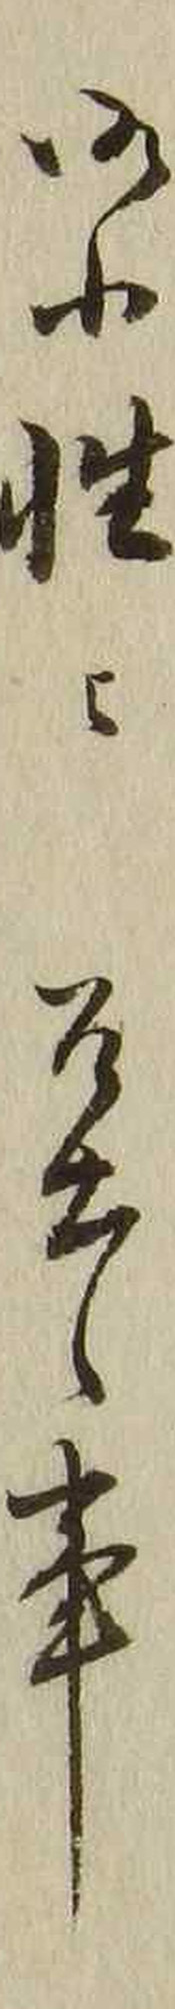御小性被召出候事
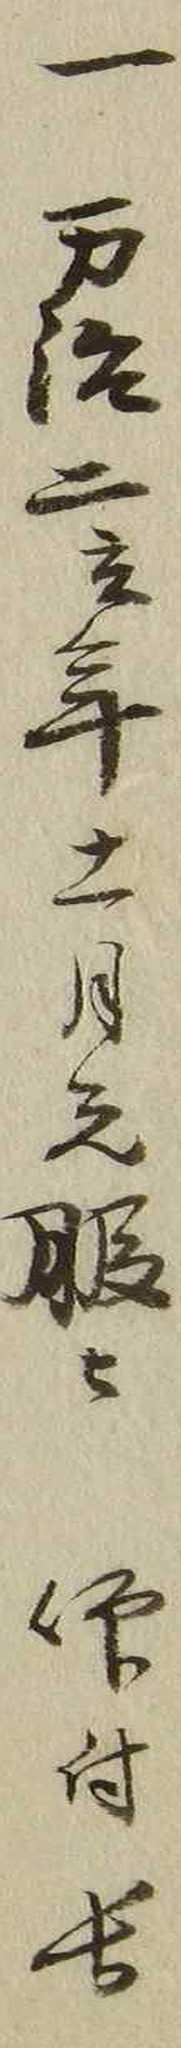一万治二亥年十一月元服被仰付長
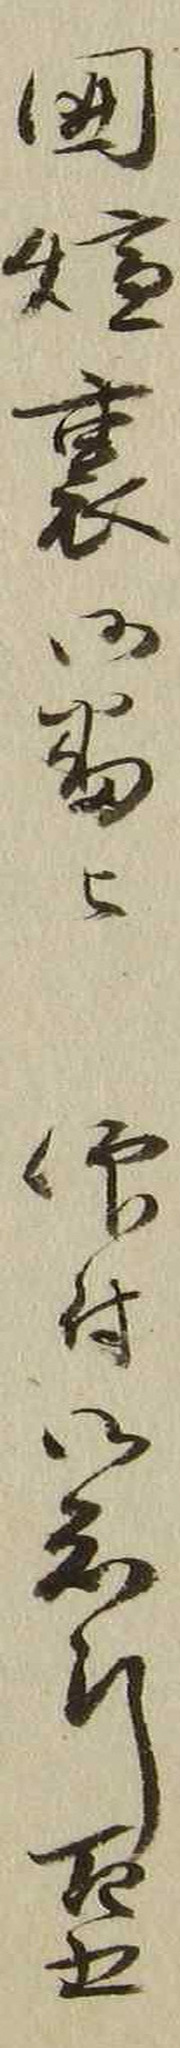囲炉裏御番被仰付御知行取立
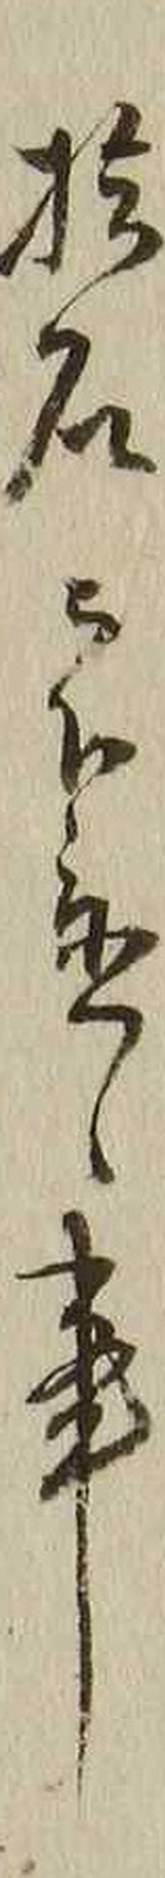拾石被下置候事
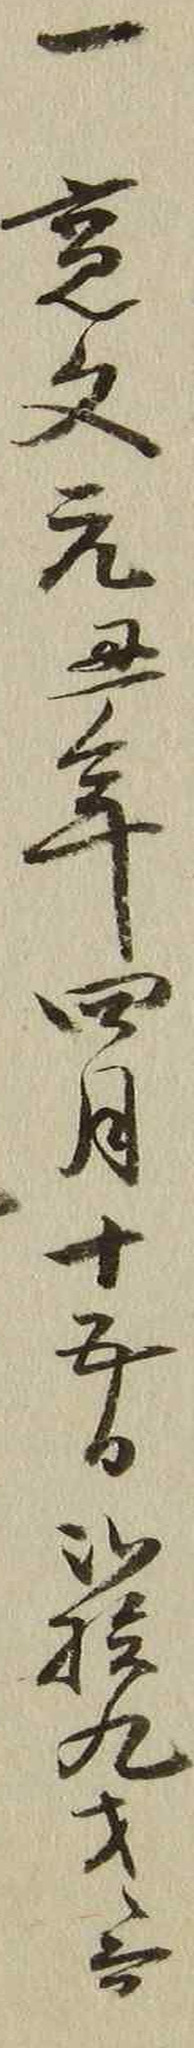一寛文元丑年四月十五日弐拾九才ニ而
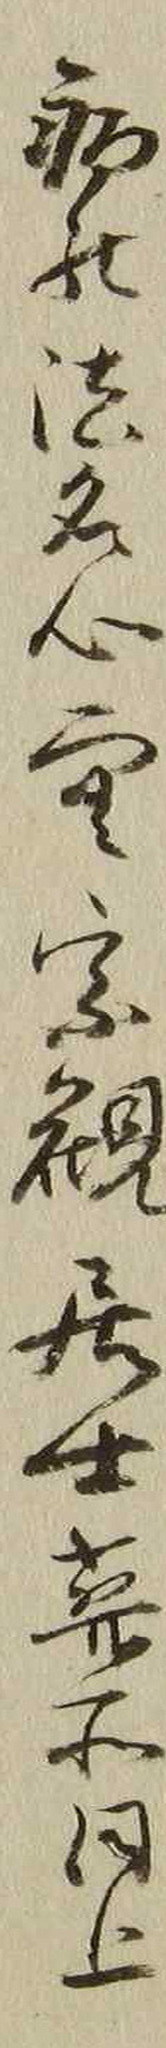病死法名心宣宗観居士葬所同上
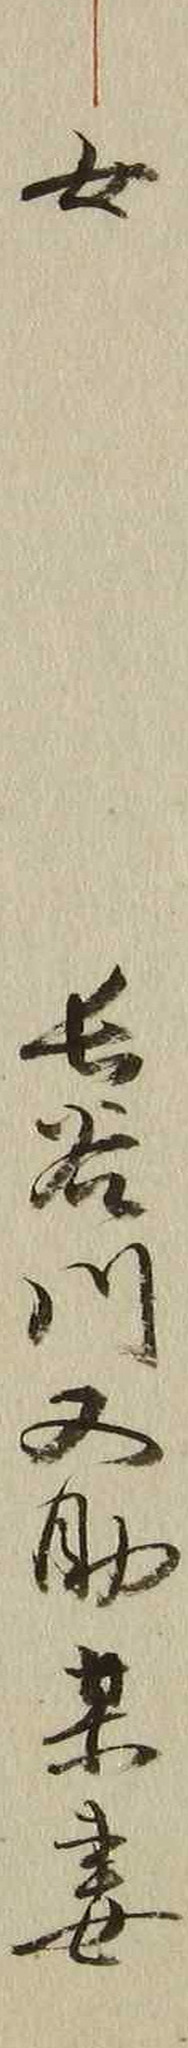女長谷川又助某妻
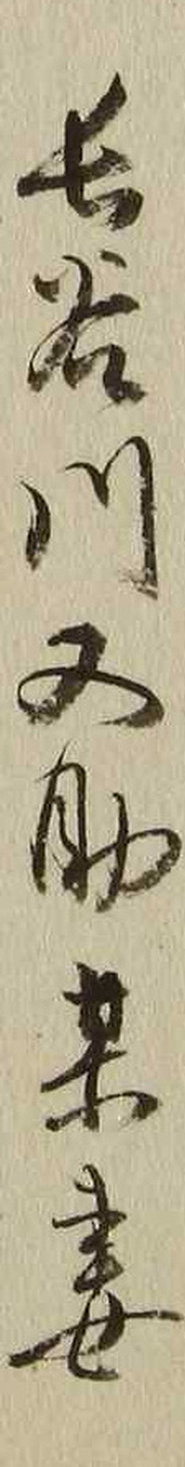女長谷川又助某妻
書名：諸士系譜　巻之236　ふ之部4
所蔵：会津若松市立会津図書館
